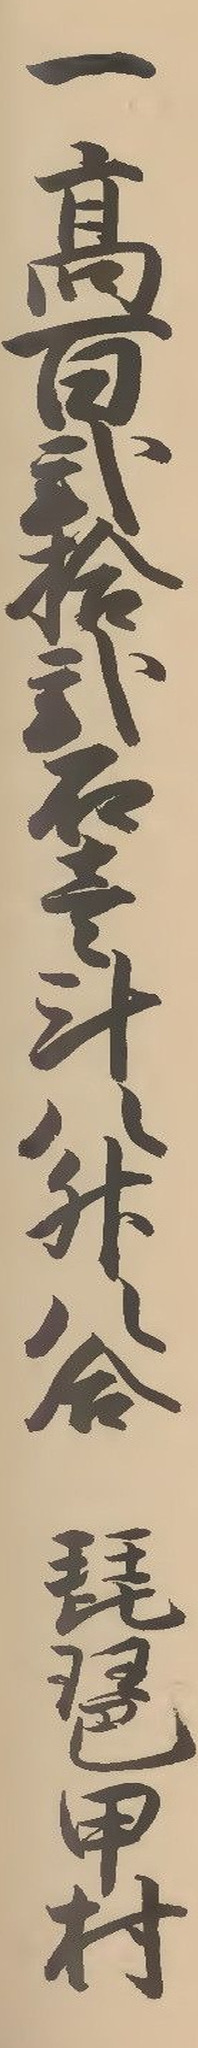一髙百弐拾弐石壱斗八升八合琵琶甲村
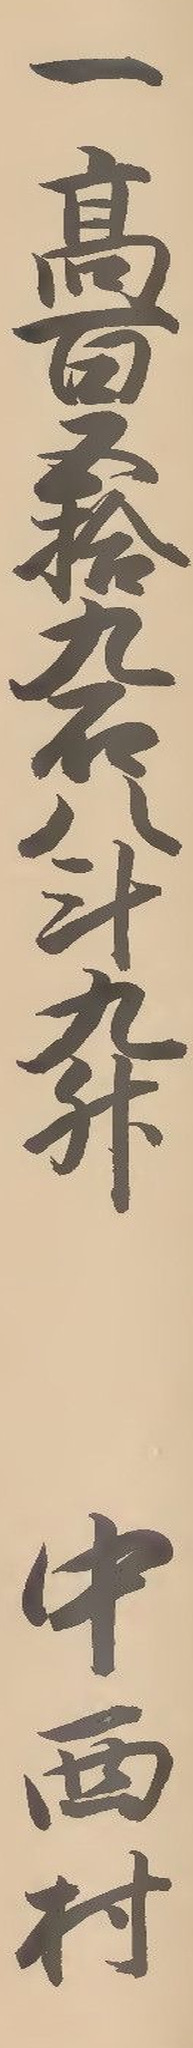一髙百五拾九石八斗九升中西村
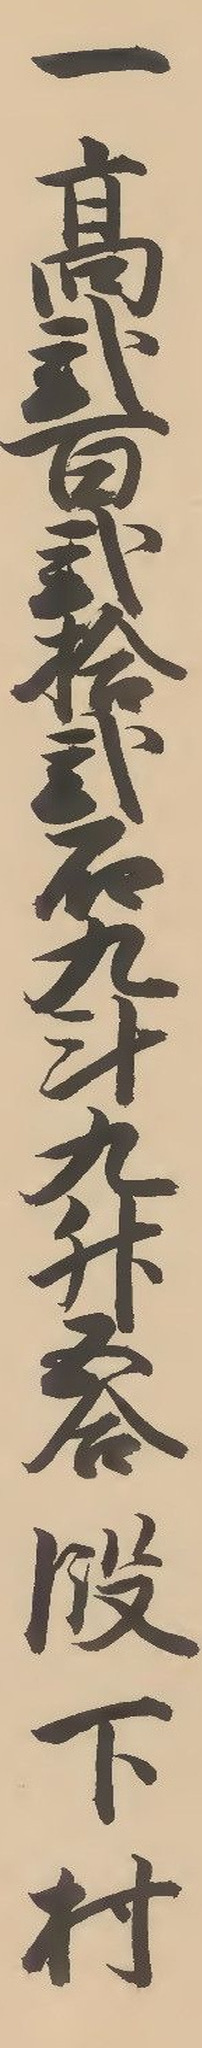一髙弐百弐拾弐石九斗九升五合段下村
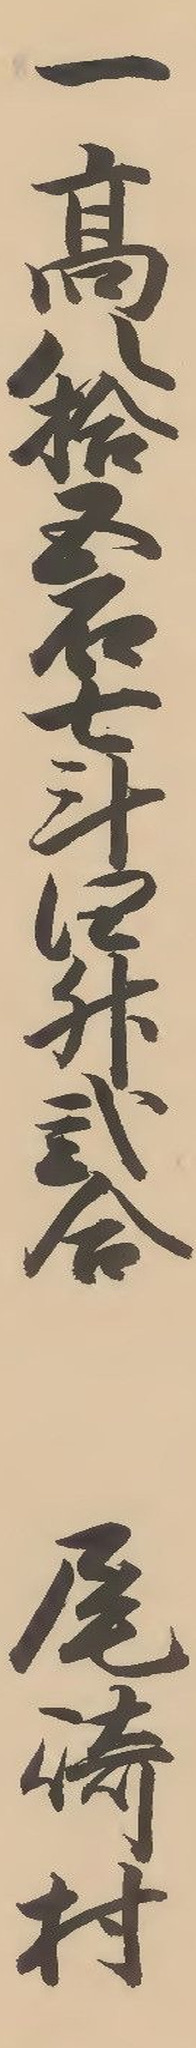一髙八拾五石七斗四升弐合尾崎村
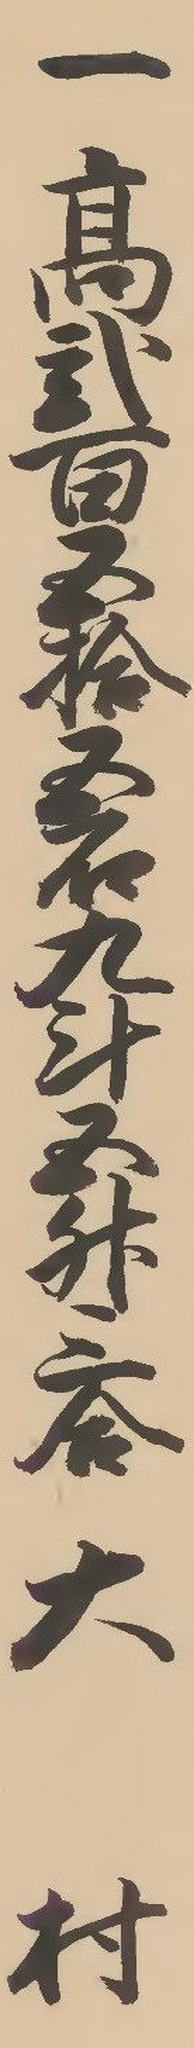一髙弐百五拾五石九斗五升三合大村

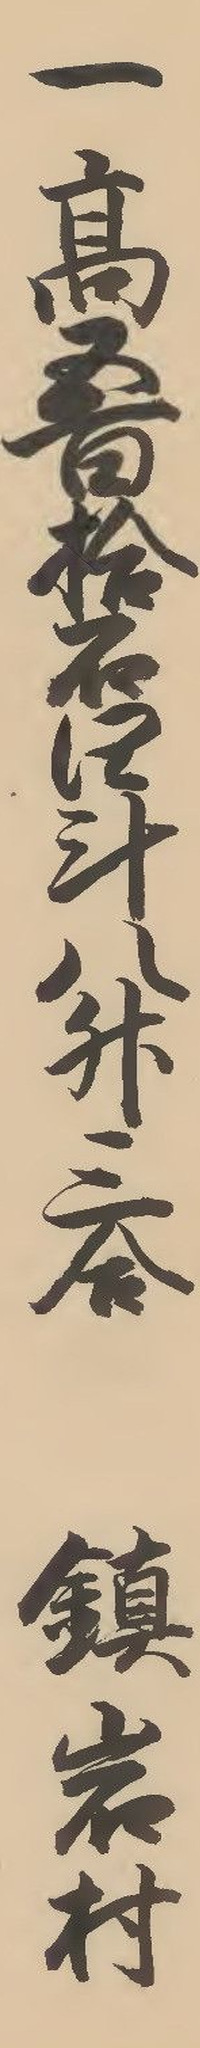一髙五百拾石四斗八升三合鎮岩村
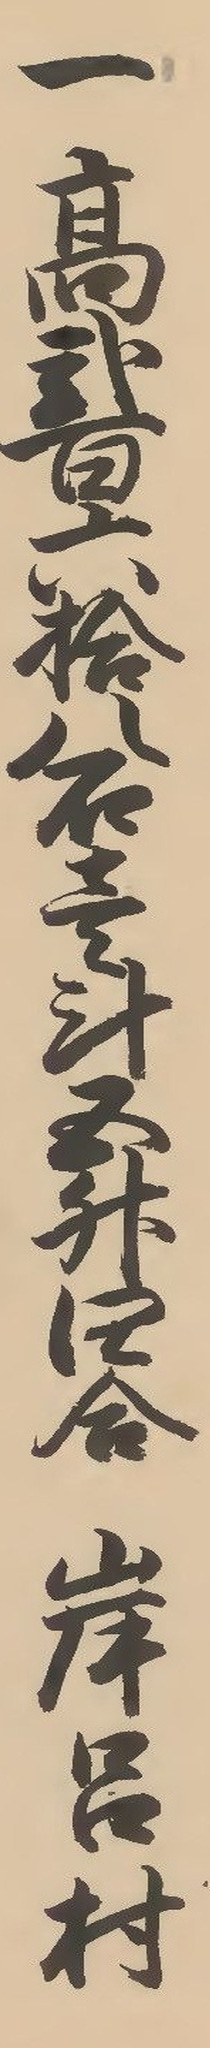一髙弐百六拾八石壱斗五升四合岸呂村
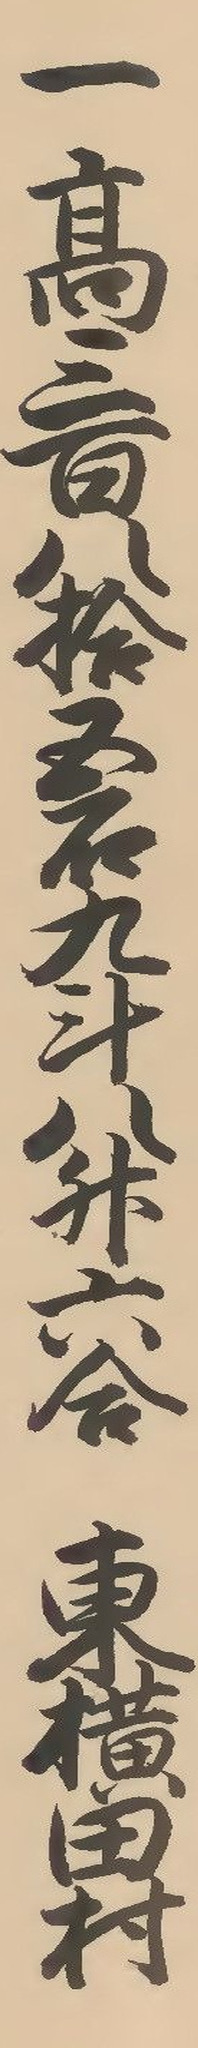一髙三百八拾五石九斗八升六合東横田村
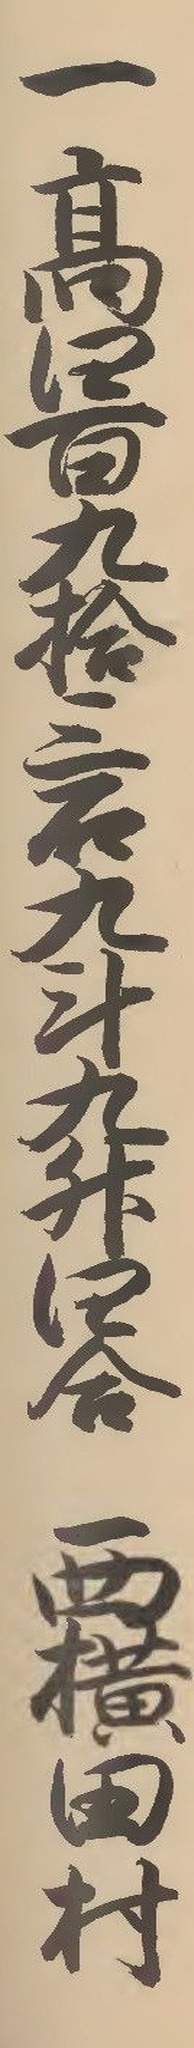一髙四百九拾三石九斗九升四合西横田村
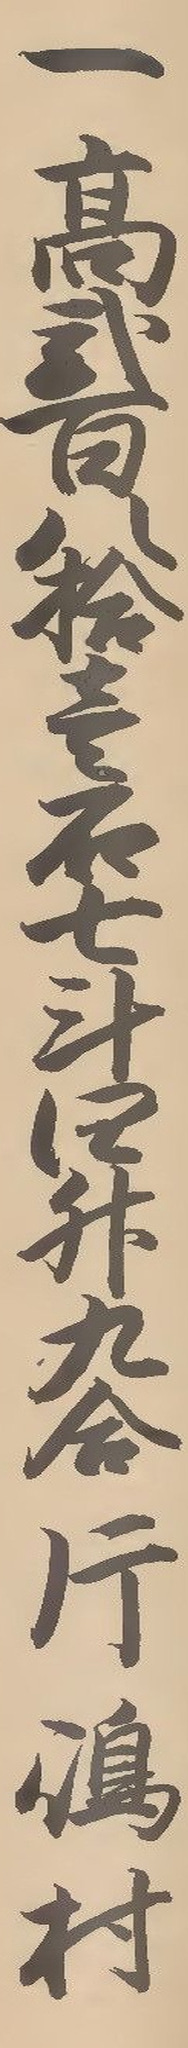一髙弐百八拾壱石七斗四升九合片嶋村
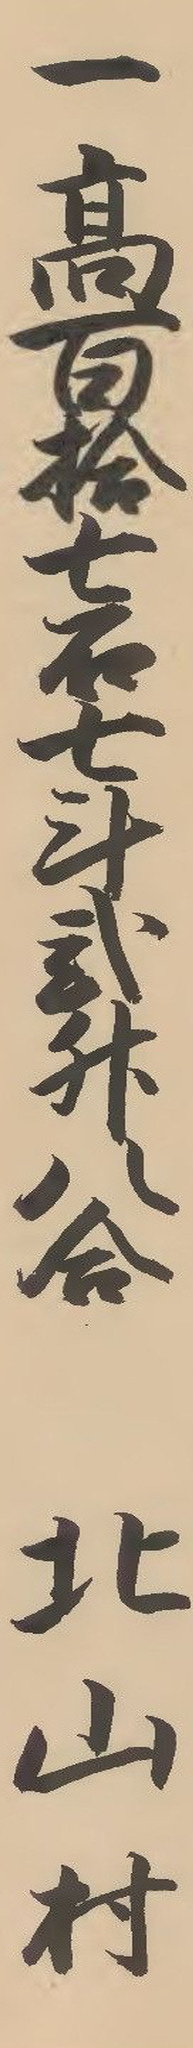一髙百拾七石七斗弐升八合北山村
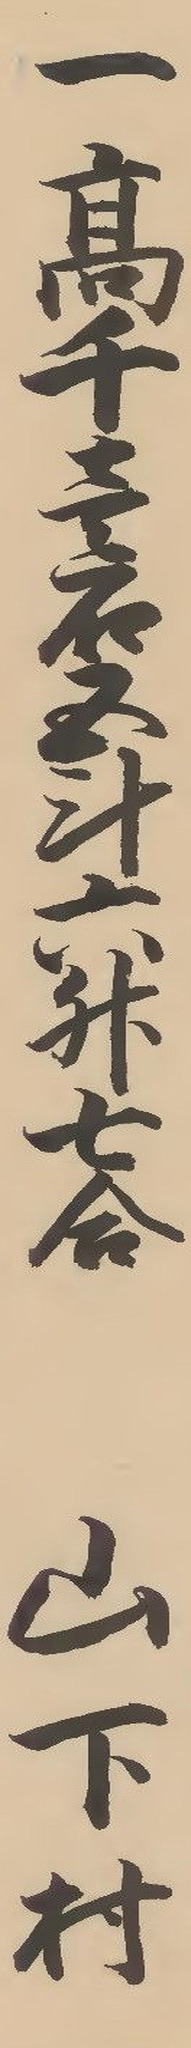一髙千壱石五斗六升七合山下村
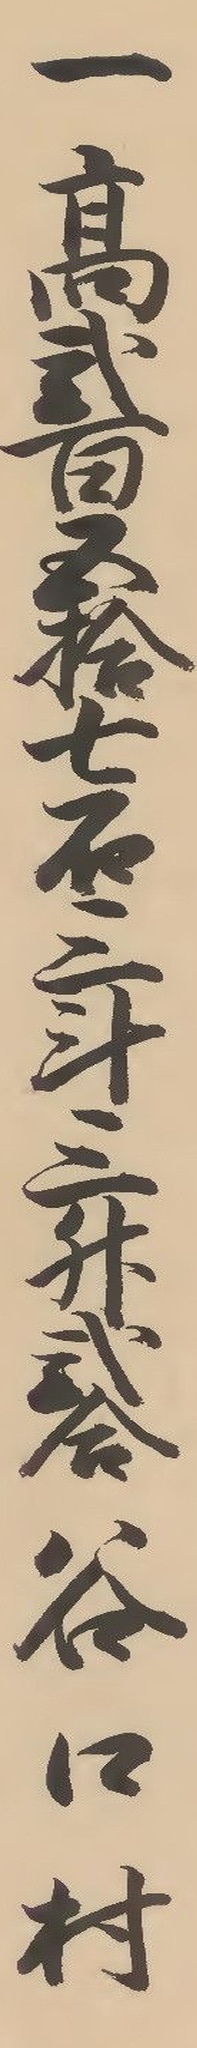一髙弐百五拾七石三斗三升弐合谷口村

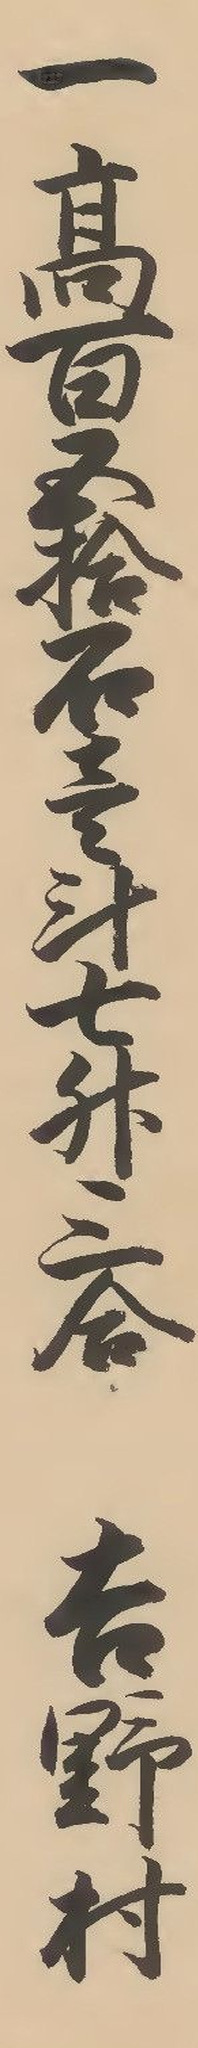一髙百五拾石壱斗七升三合吉野村
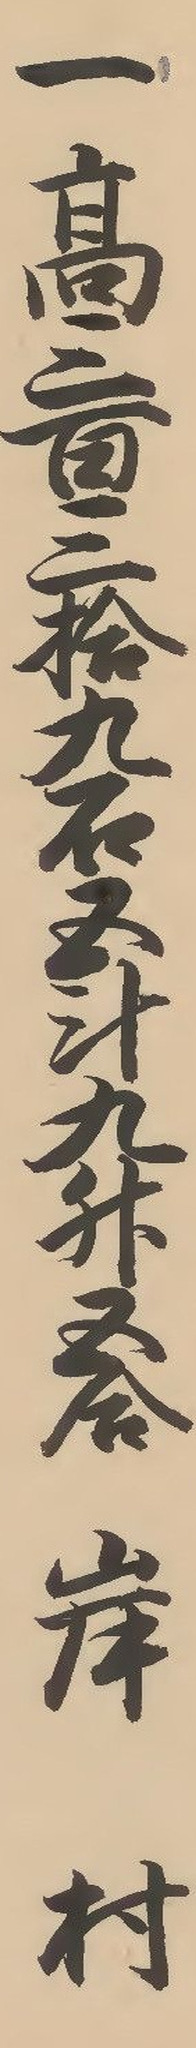一髙三百三拾九石五斗九升五合岸村
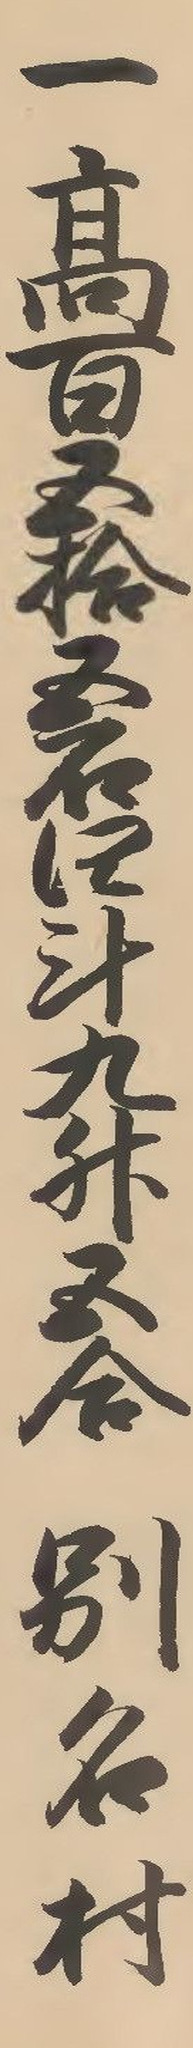一髙百五拾五石四斗九升五合別名村
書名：播磨国郷帳
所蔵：国立公文書館 National Archives of Japan
